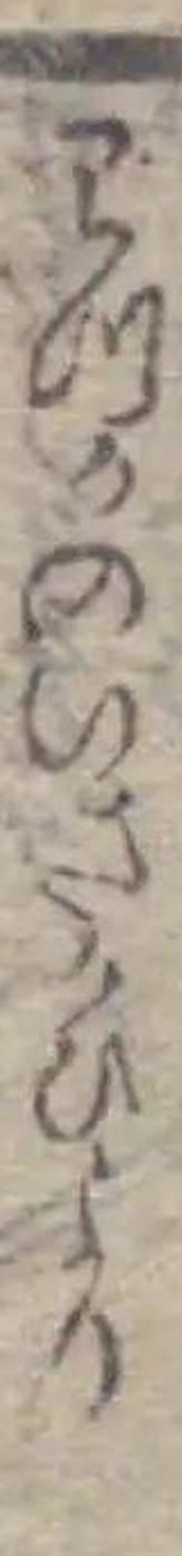わつかのいさかひより
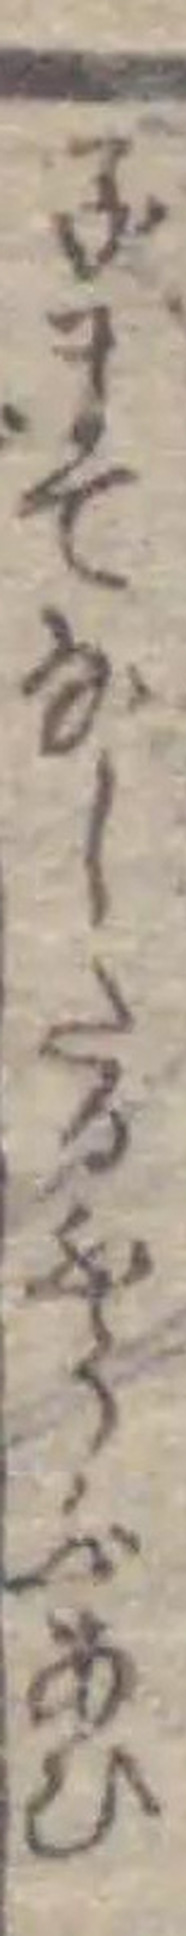子まてなしたるふうふあひ
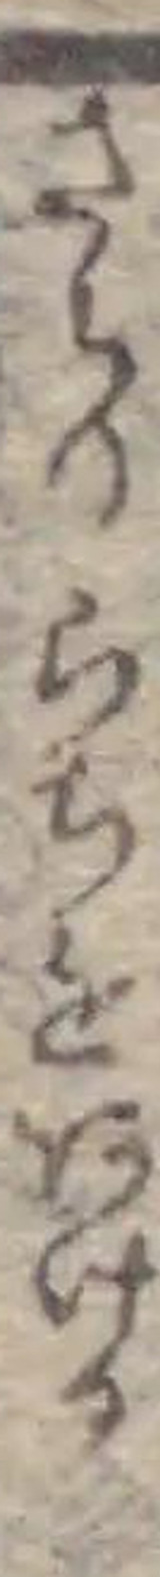さらりらちをあける
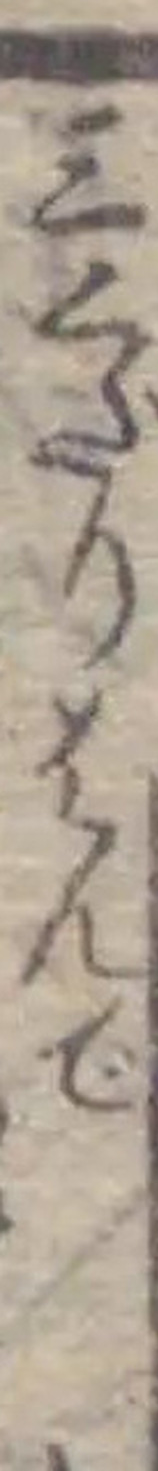三くだりはんで
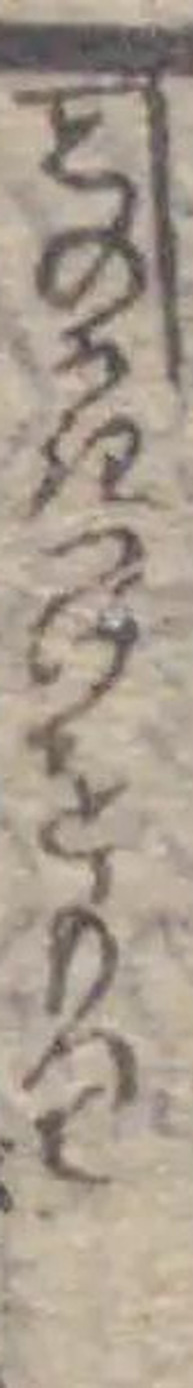〽このかきつけをもつて
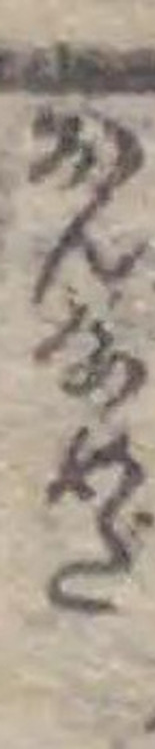おんなめだ
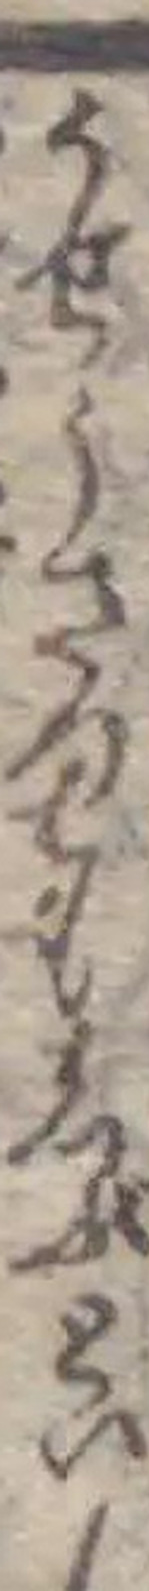うせうさつてもしぶとい
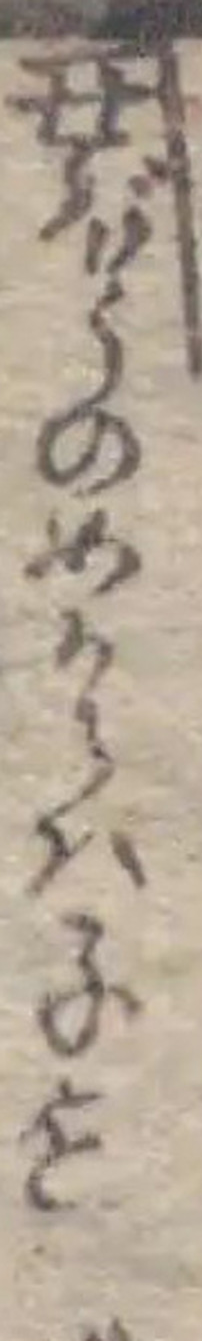〽女ぼうのめからは子を
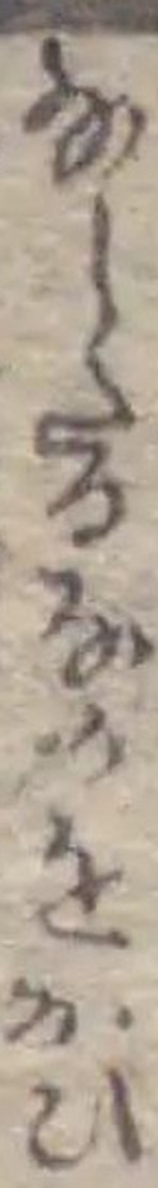なしたるなかをおひ
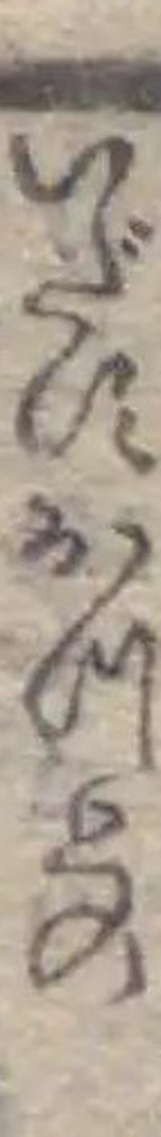いだすおつとの
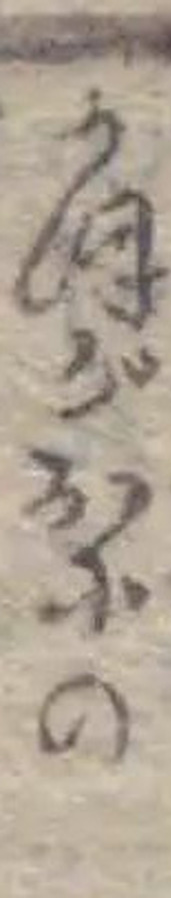かほがおにの
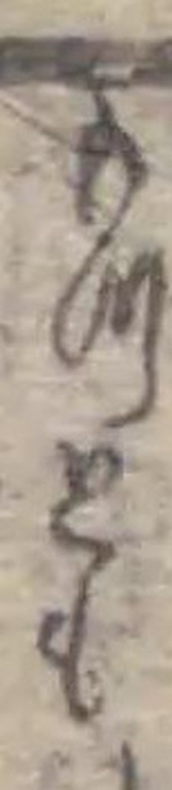もつとも
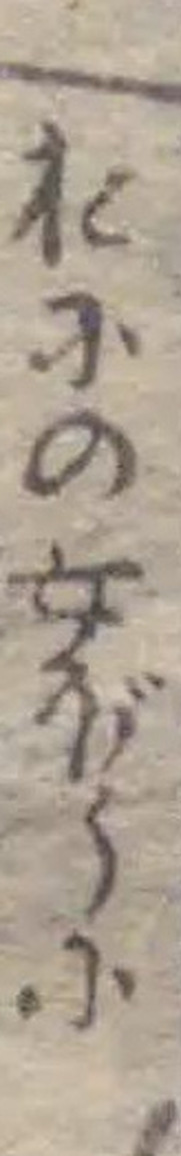おにの女ぼうに
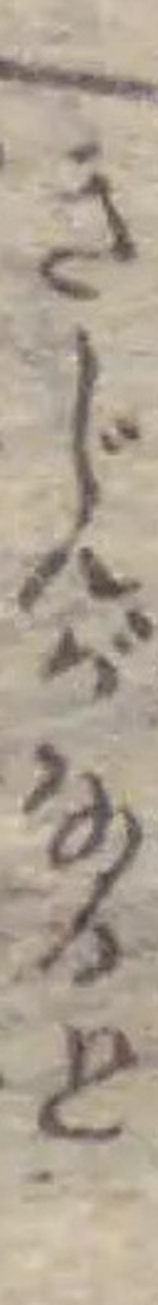きじんがなると
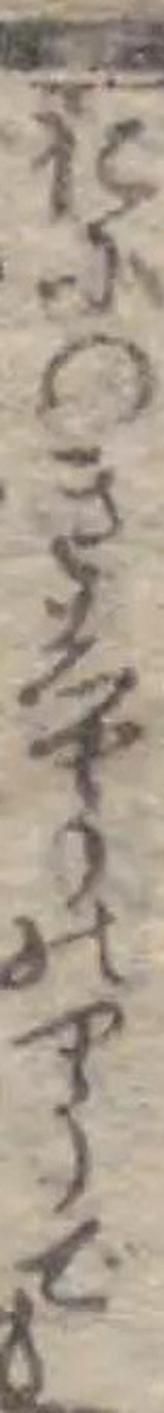〽おにのきしやうのやうでも
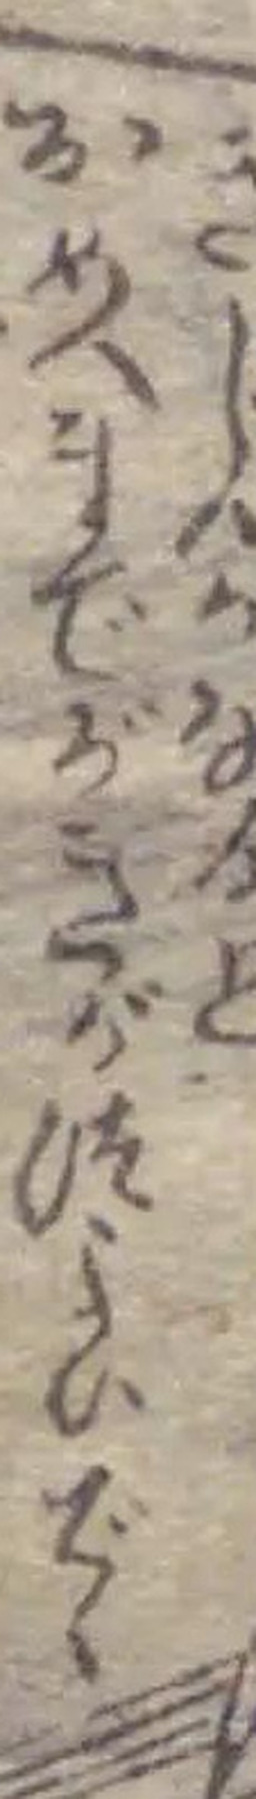おめへまでがきがつよいでゝ
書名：福壽海旡量品玉 3巻
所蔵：国立国会図書館 National Diet Library, JAPAN
